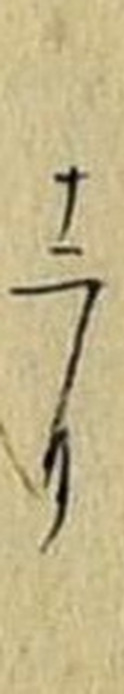十二月
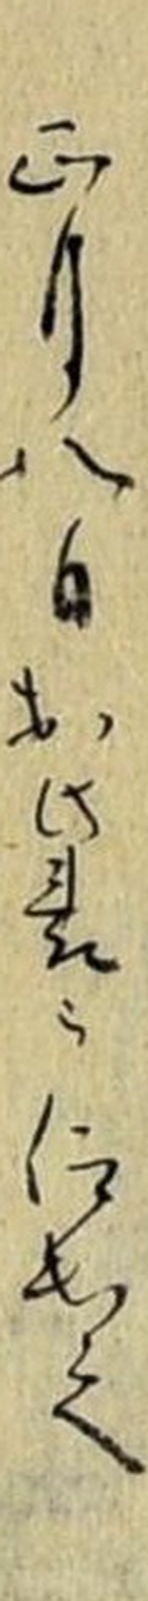正月八日於此表被仰出之
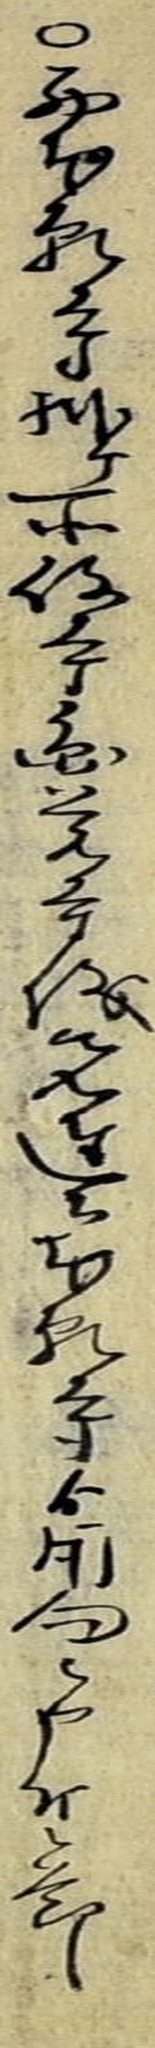○西本願寺掛ヶ所役寺円光寺儀先達而本願寺ゟ用向被申付候節
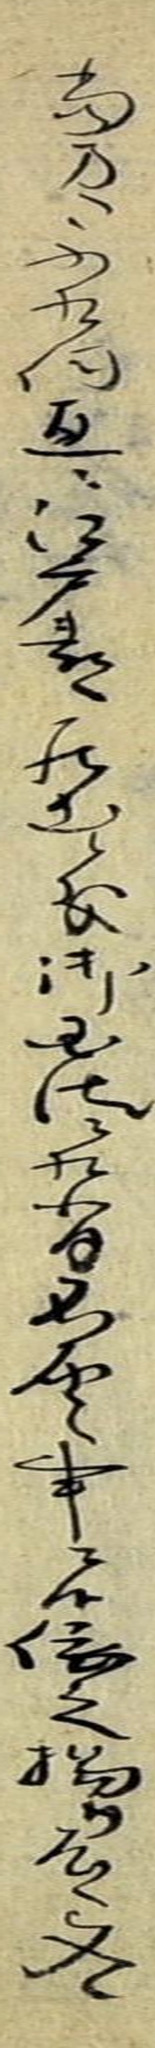当方へ不相伺直々江戸表へ罷出候義御国法に相背不届之事に候依之揚り屋へ被入候
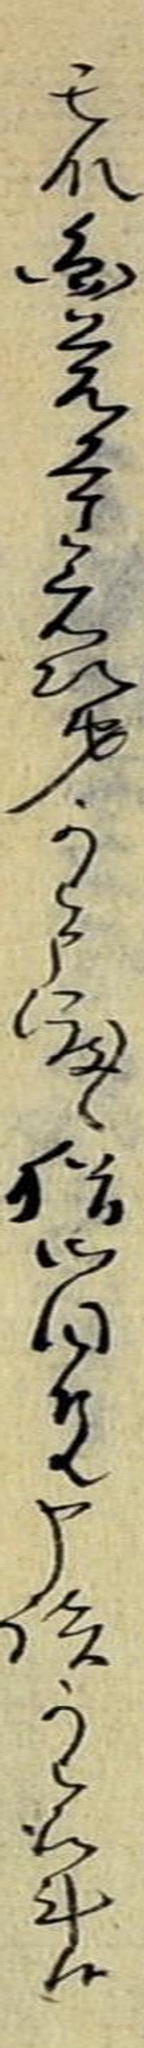其段円光寺着次第可被申渡候猶御目付共申談可被取斗候
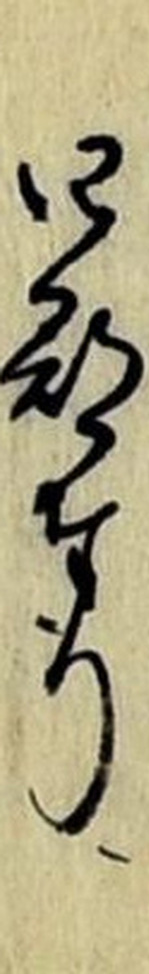四郡奉行
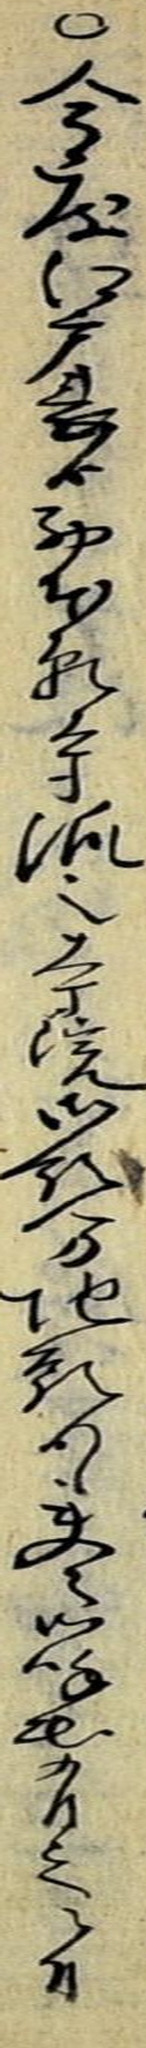○今度江戸表ゟ西本願寺派之寺院御領分地頭共も夫々御呼出有之に付
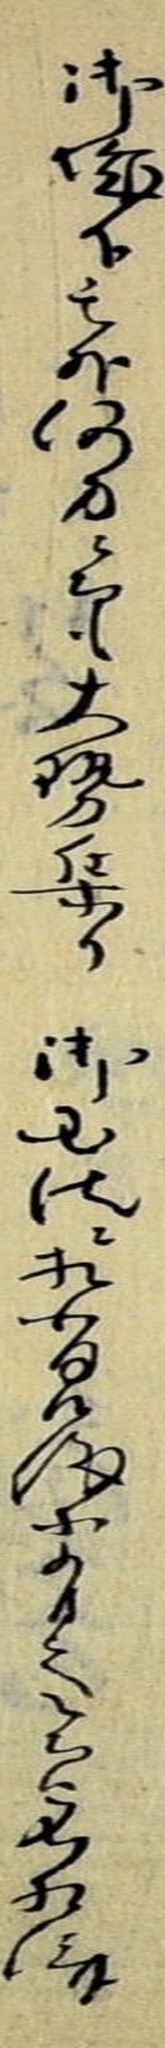御城下其外何方に而も大勢集り御国法に相背候儀等有之候而は不相済
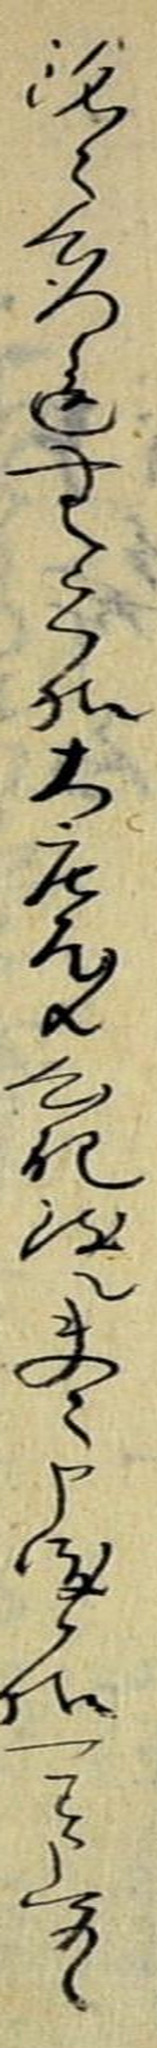銘々心得違無之様大庄屋共心配致し夫々申渡候様可被申聞候
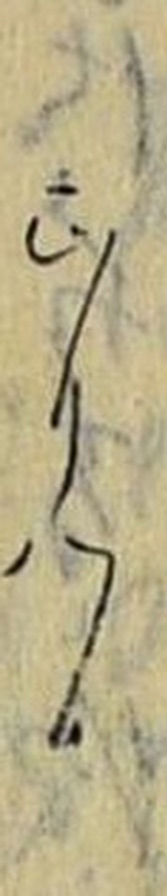正月八日
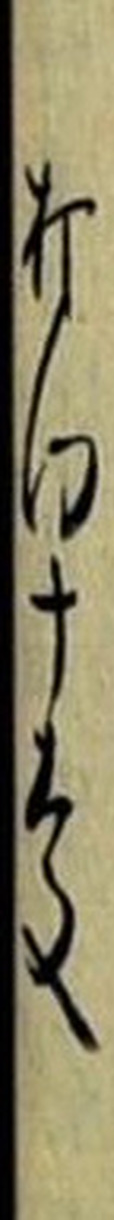村田十太夫
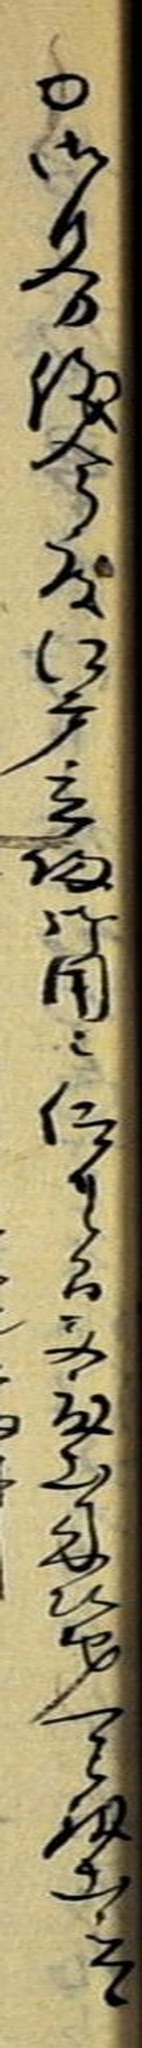○御自分儀今度江戸立帰御用被仰付候間支度出来次第可致出立候
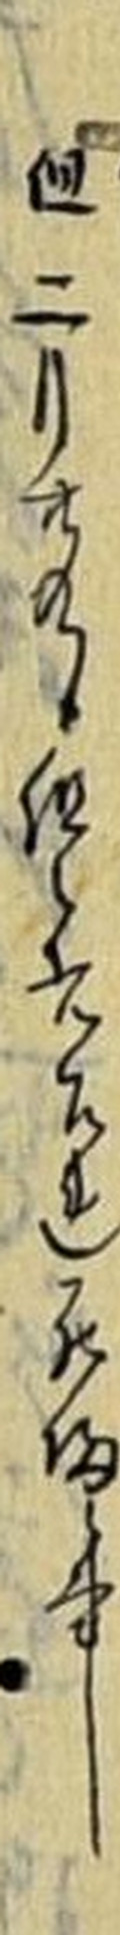但二月廿九日組之者召連罷帰候事
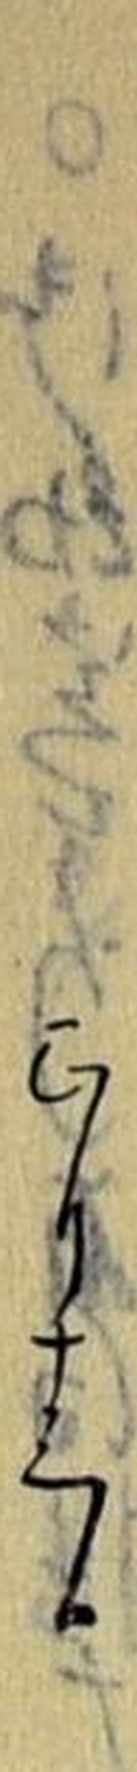正月十三日
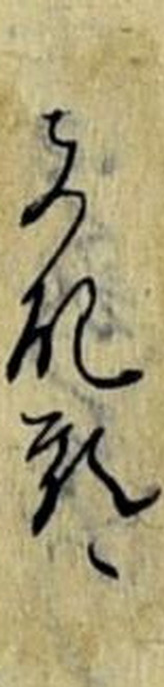支配頭へ
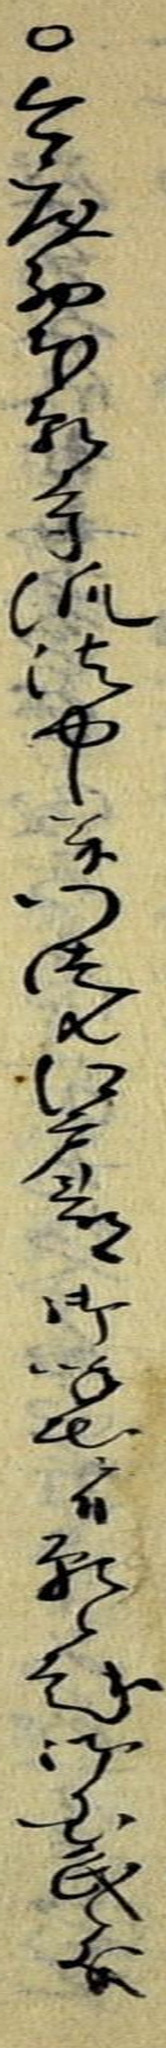○今度西本願寺派法中并門徒共江戸表へ御呼出に付願之趣御国民之義
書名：命令之部 四
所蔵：福井県文書館 Fukui Prefectural Archives
